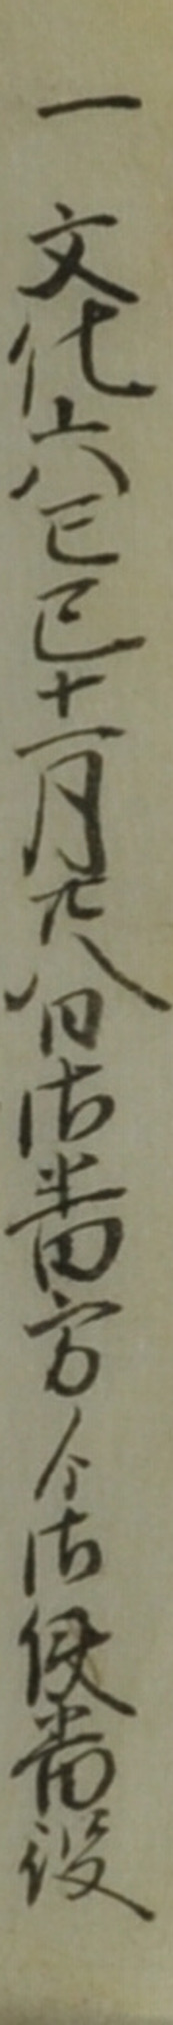一文化六己巳十一月廿八日御番方より御使番役
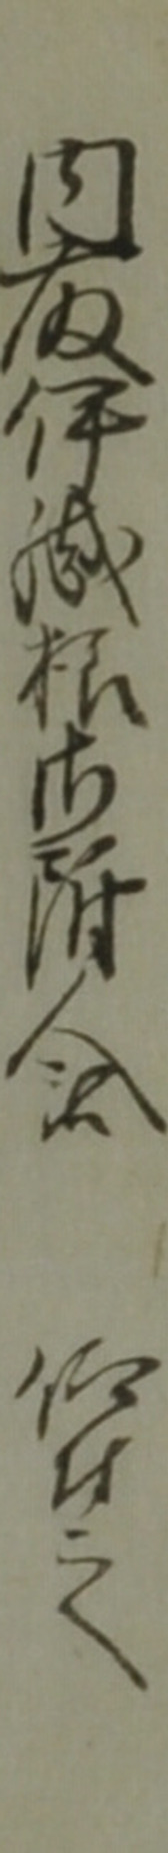内藤伊織様御附人被仰付之
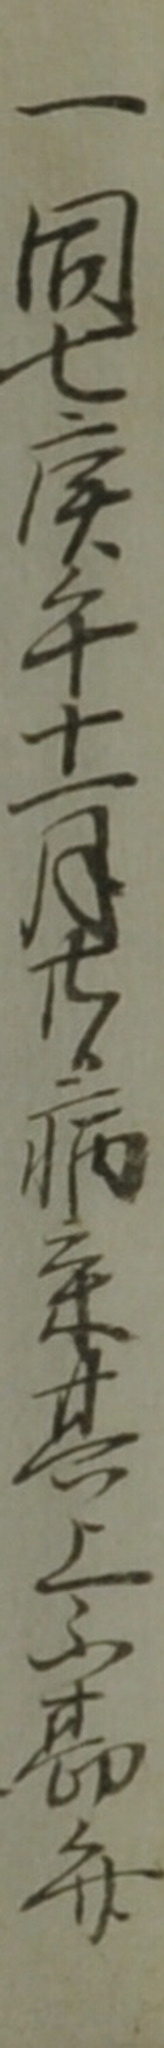一同七庚午十一月廿日病気其上不勘弁
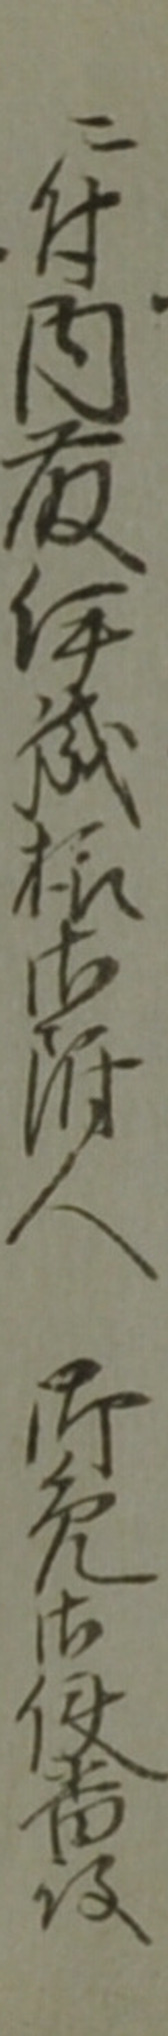ニ付内藤伊織様御附人御免御使番役
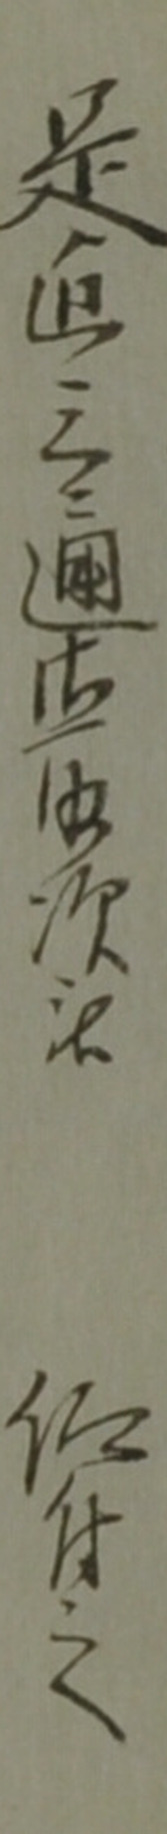是迄之通御取次被仰付也之
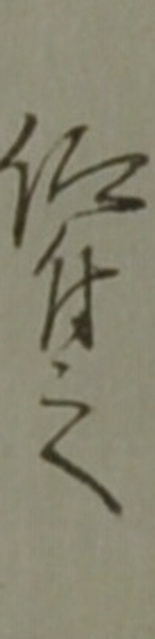仰付之
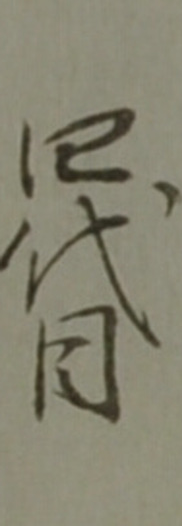四代目
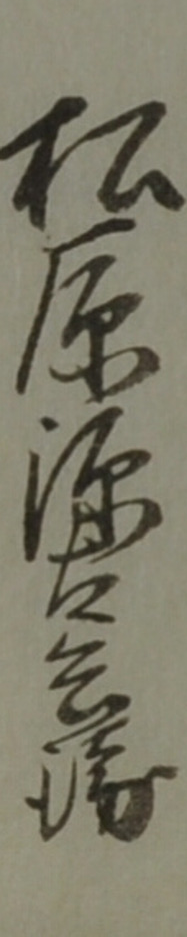松原源太兵衛
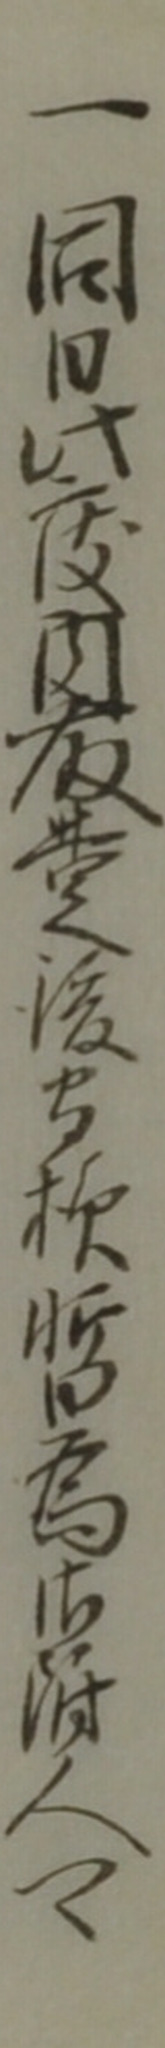一同日此度内藤豊後守様暫為御附人可
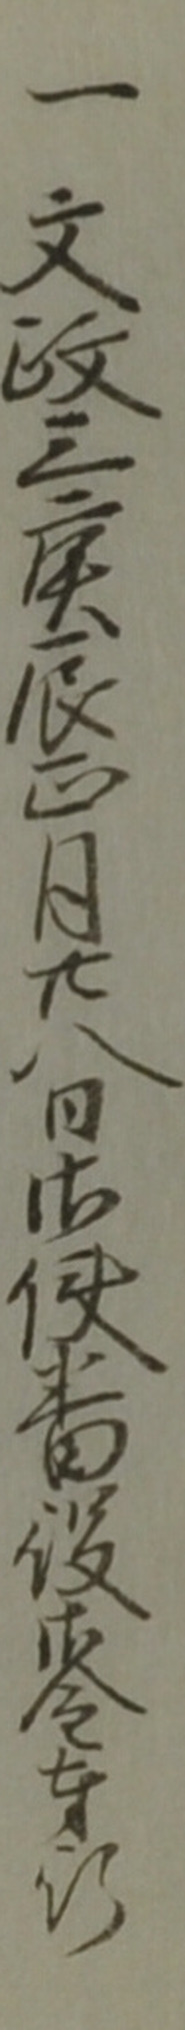一文政三庚辰正月廿八日御使番役御金奉行
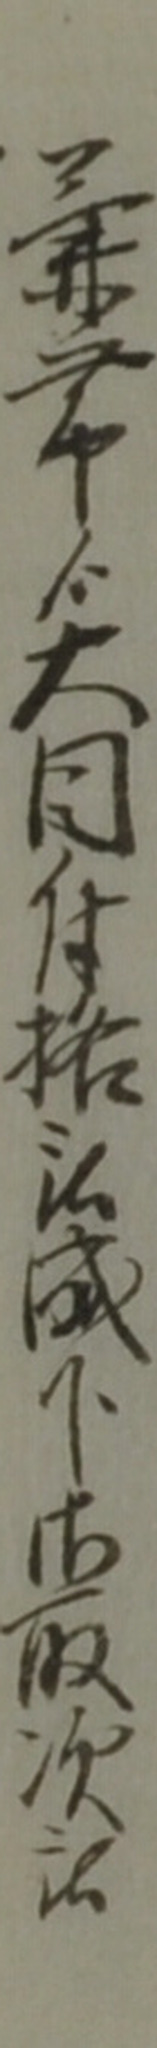兼帯より大目付格被成下御取次被
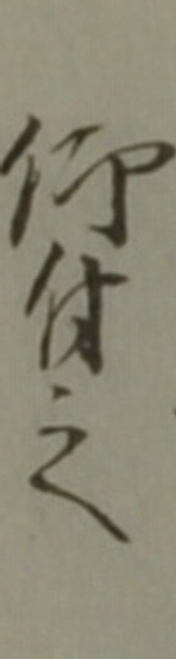仰付之
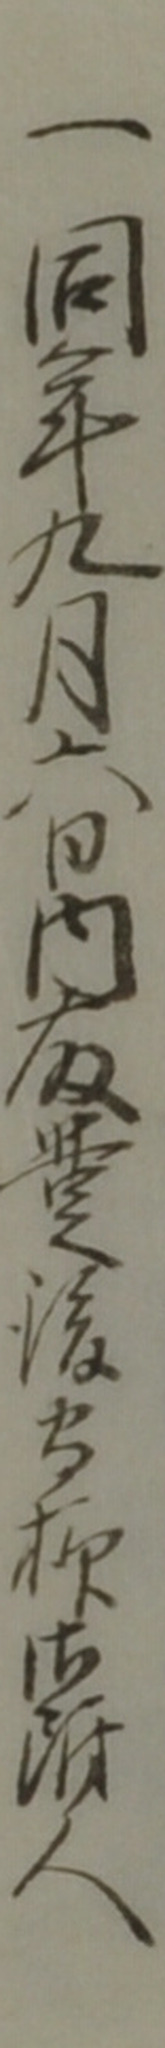一同年九月六日内藤豊後守様御附人
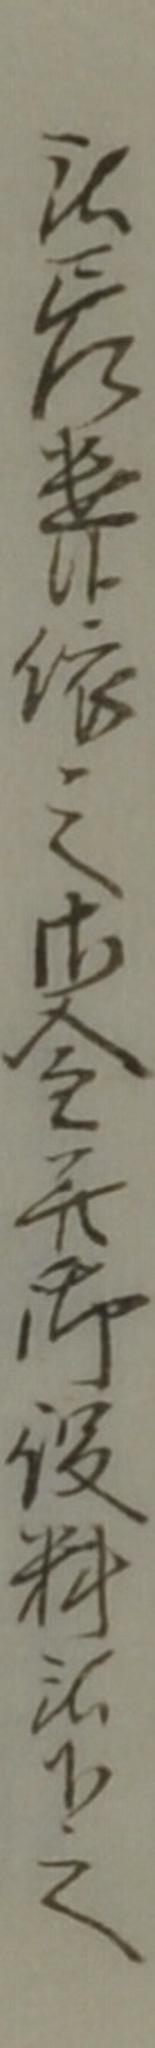被差遣候依之御金并御役料被下之
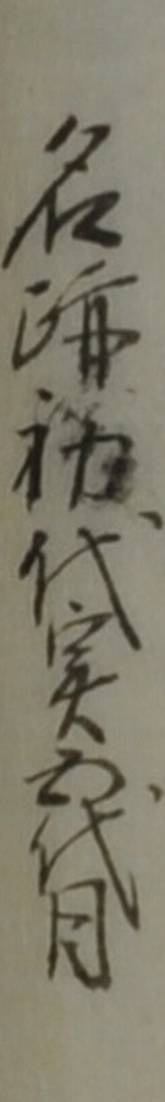名跡初代実五代目
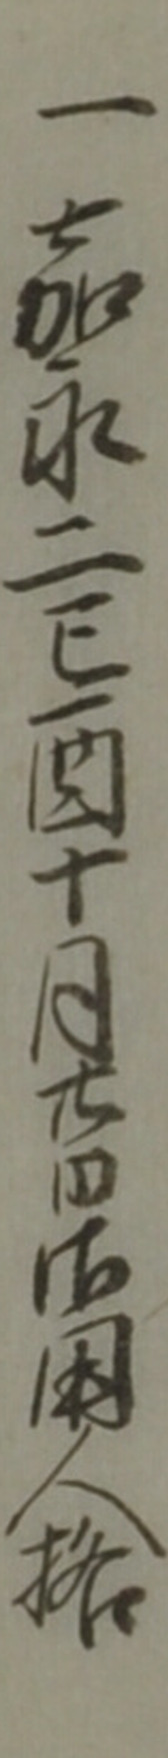一嘉永ニ己酉十月廿日御用人格
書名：諸御役代々録（八）
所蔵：伊那市立高遠町図書館・合同会社AMANE
